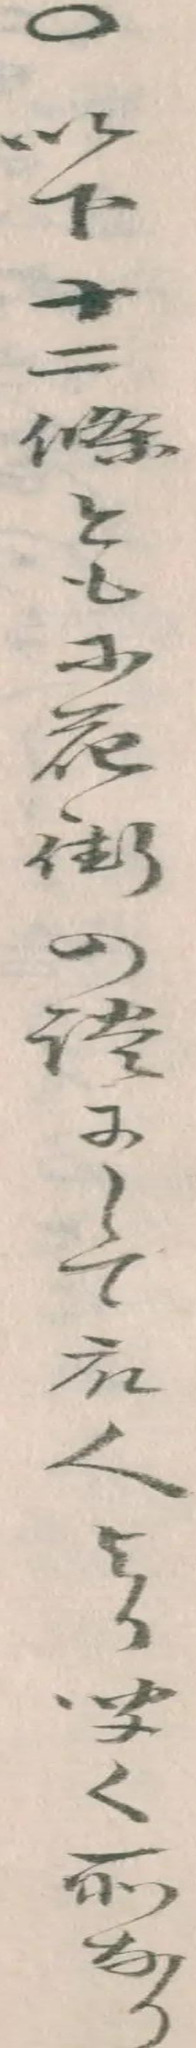〇以下十二条ともに花街の談にして衆人より聞く所なり
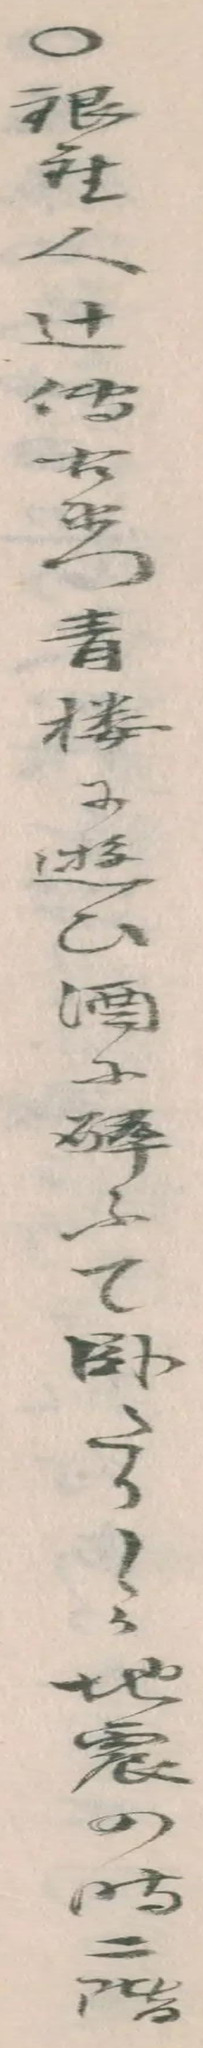〇銀座人辻伝右衛門青楼に遊ひ酒に酔ふて臥たりしか地震の時二階
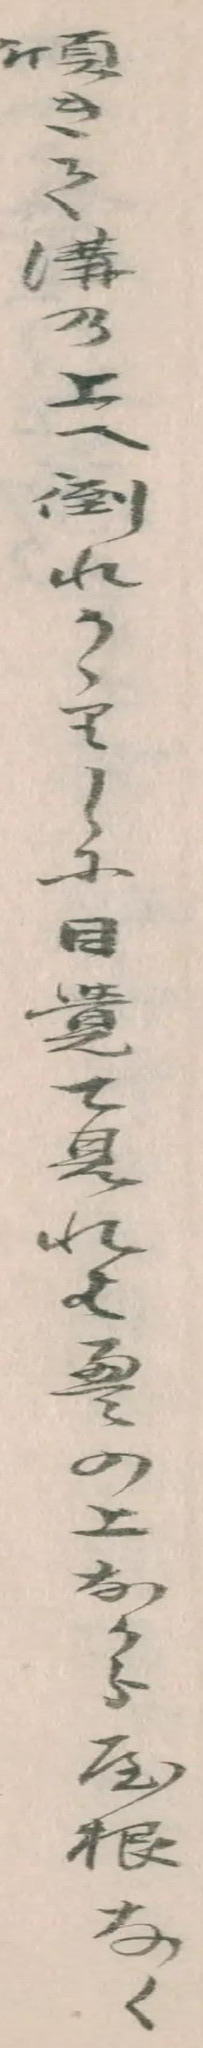傾きて溝の上へ倒れかゝりしに目覚て見れは畳の上なから屋根なく
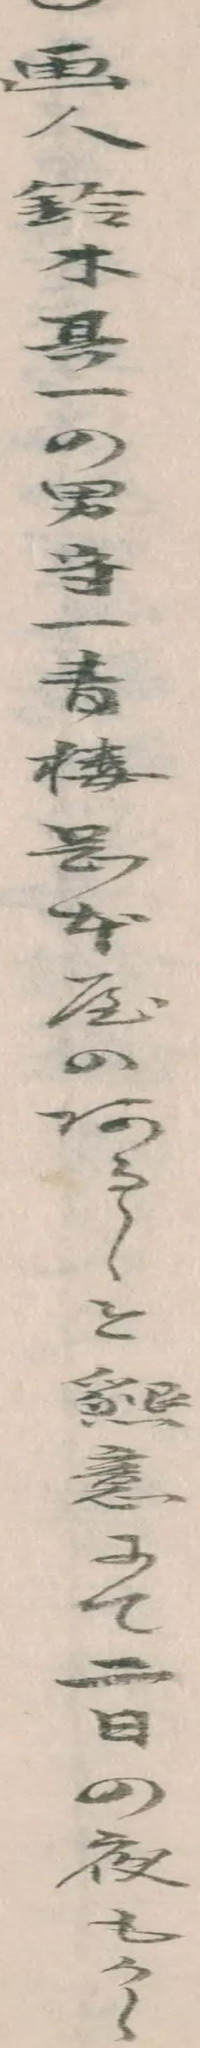〇画人鈴木其一の男守一青楼岡本屋のあるしと懇意にて二日の夜もかし
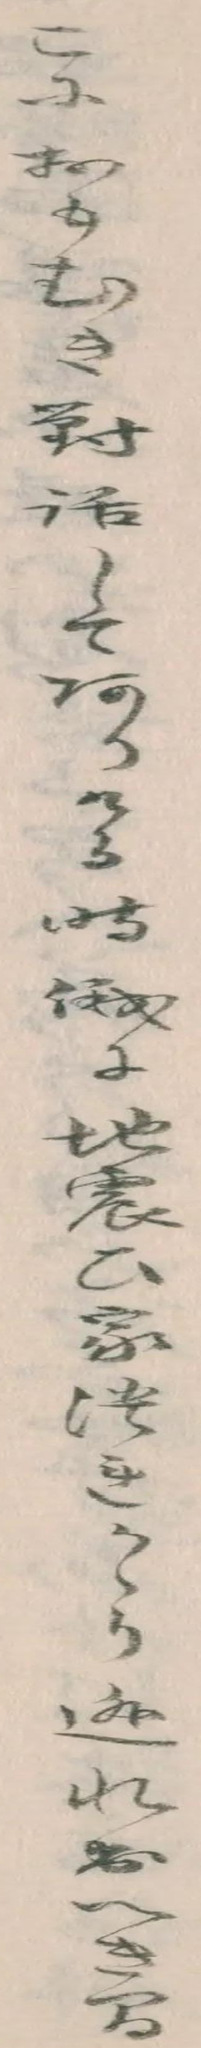こにおもむき対話してありける時俄に地震ひ家潰れかゝり逃れ出へき間
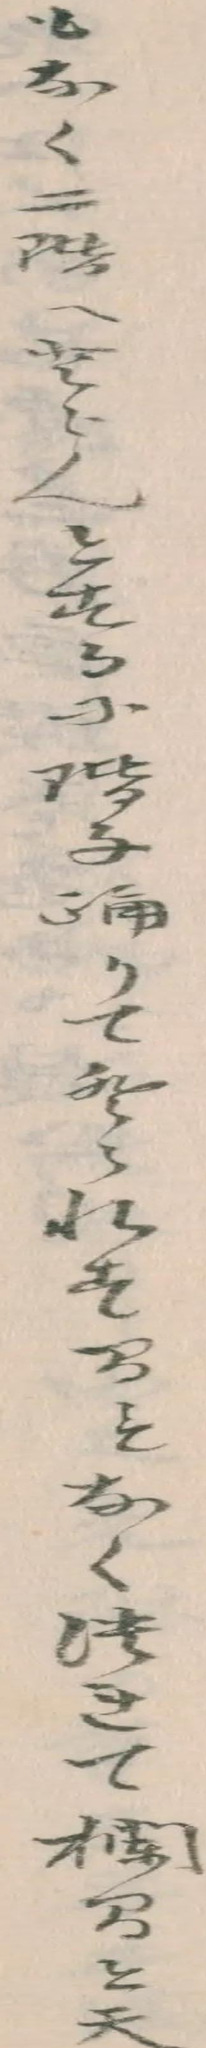もなく二階へ登らんとするに階子踊りて登られす間もなく潰れて欄間と天
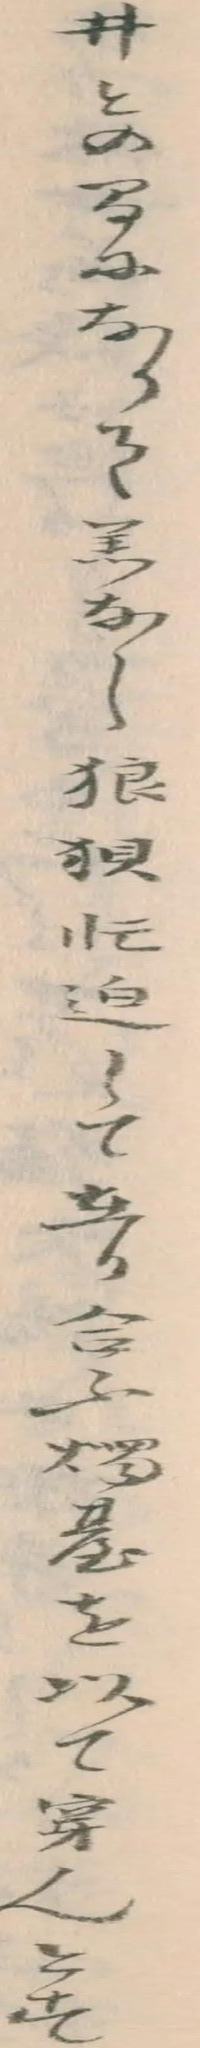井との間になりて恙なし狼狽忙迫して在り合ふ燭台を以て穿んとす
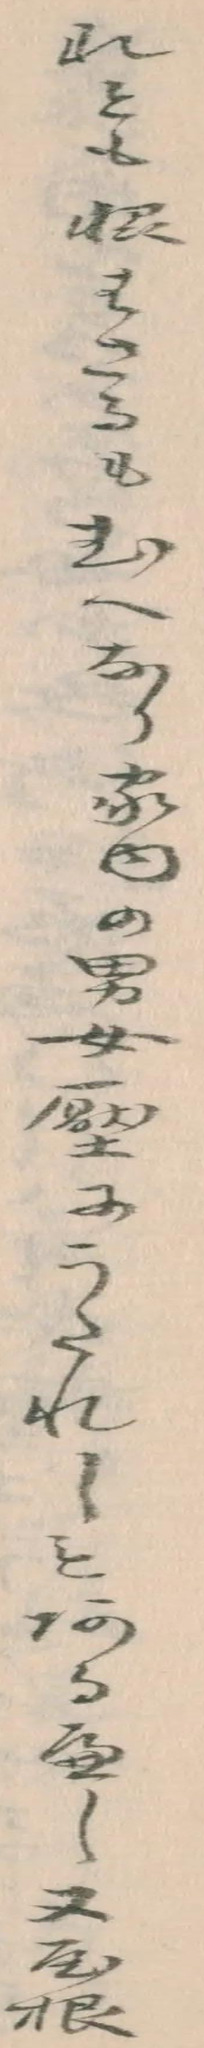れとも脇はさるもむへなり家内の男女圧にうたれしもあるへし又屋根
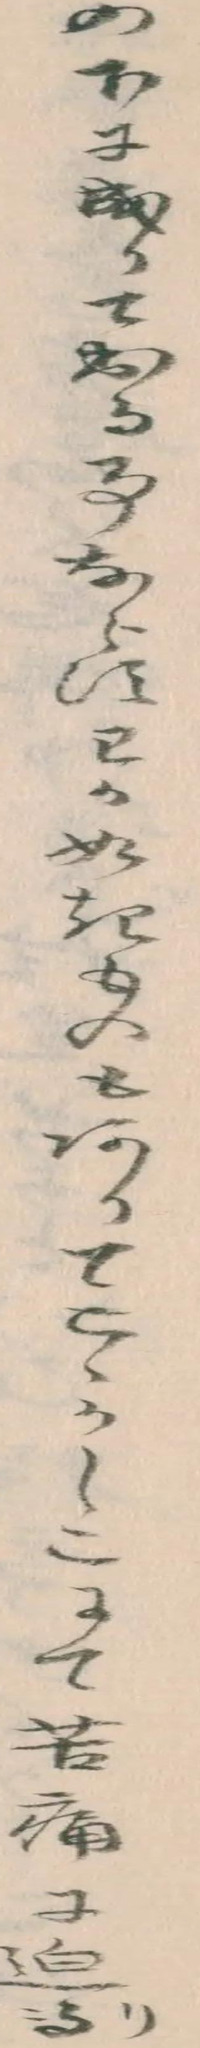の下に成りて出る事ならすわか如きものもありてこゝかしこにて苦痛に迫る
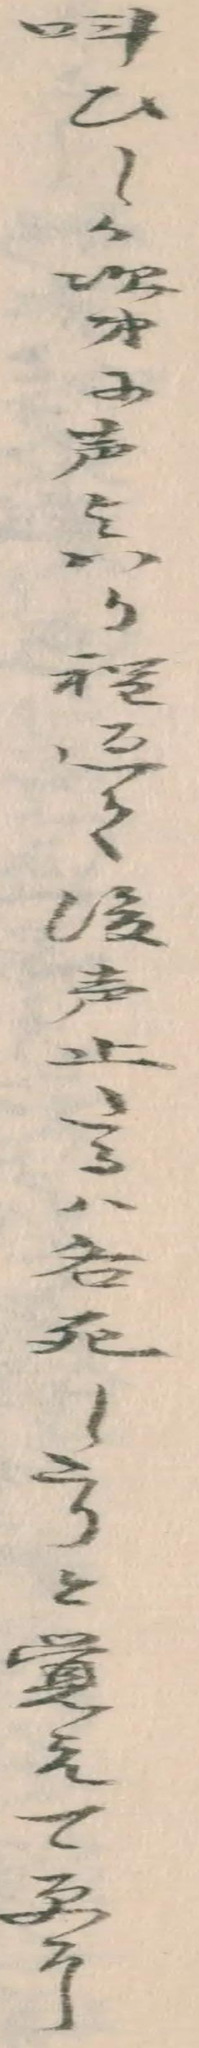叫ひしか次第に声よはり程過て後声止たるは各死したりと覚えて更に
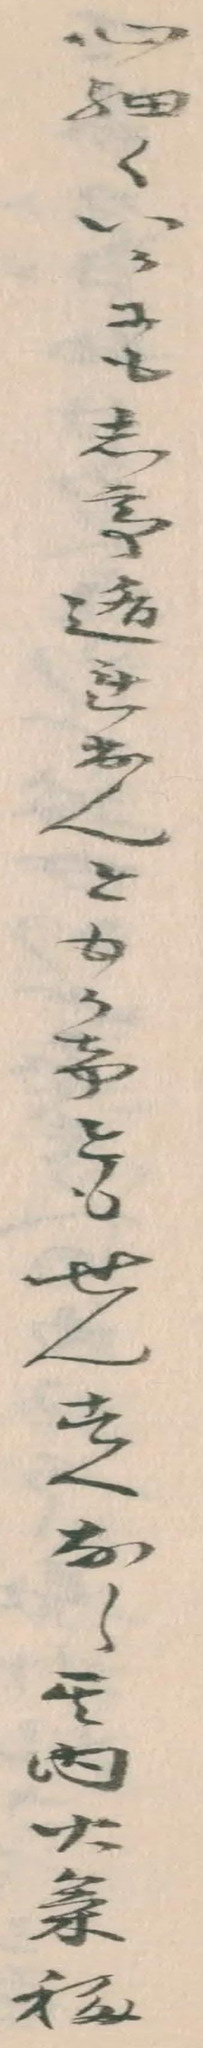心細くいかにもして遁れ出んともかけともせんすへなし其内火気移
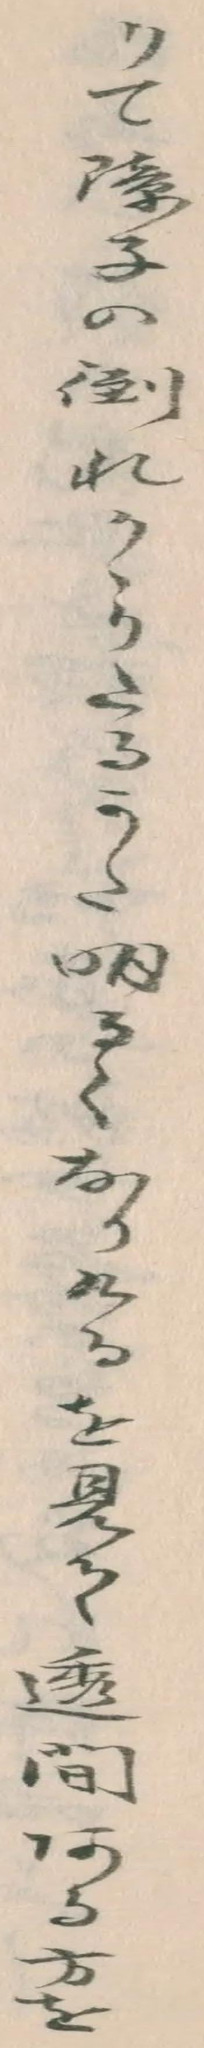りて障子の倒れかゝりたるかた明るくなりけるを見て透間ある方を
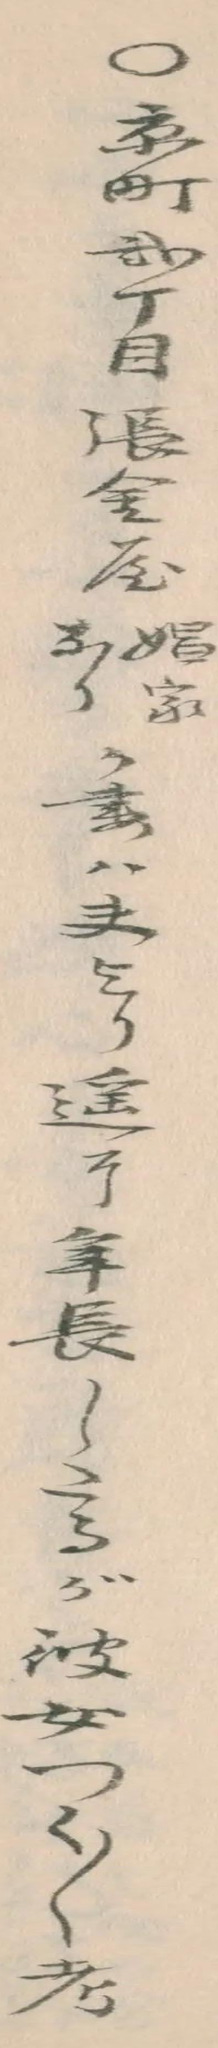〇京町弐丁目張金屋娼家なりか妻は夫より遥に年長したるが彼女つく〳〵考

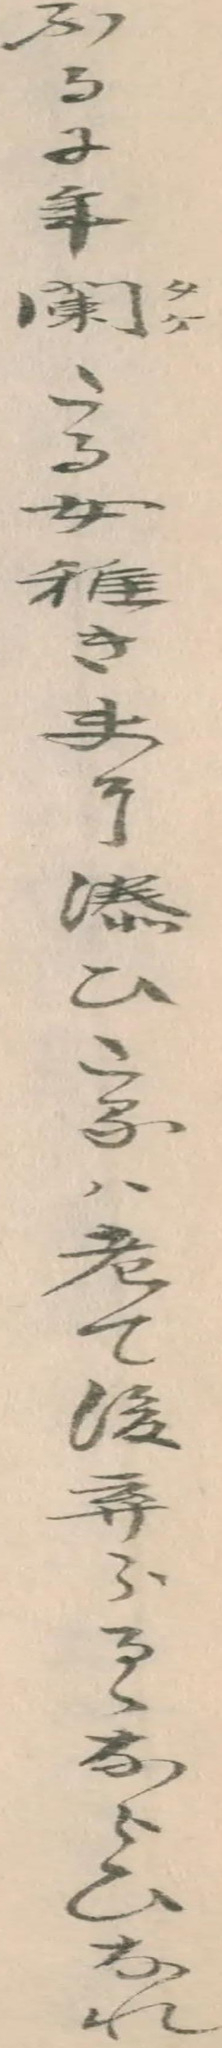ふるに年闌たる女稚き夫に添ひたるは老て後棄らるゝならひなれ
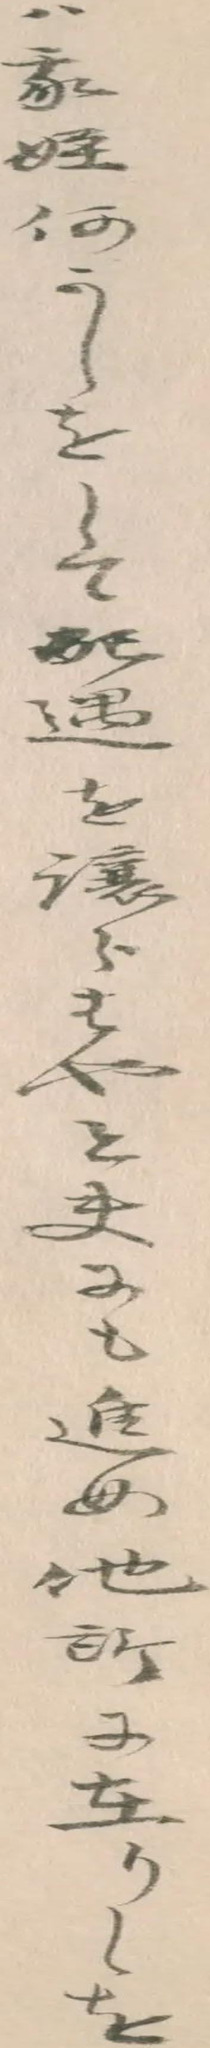は我姪何かしをして配偶を譲らはやと夫にも進め他所に在りしを
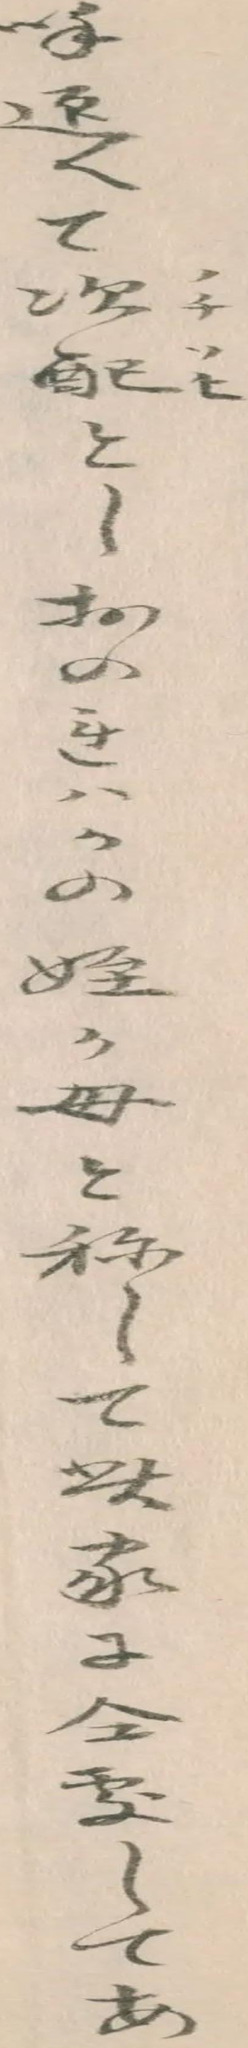呼迎へて次配としおのれはかの姪か母と称して此家に仝処してあ
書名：地災撮要. 巻10(地震之部) 上,下
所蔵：国立国会図書館 National Diet Library, JAPAN
